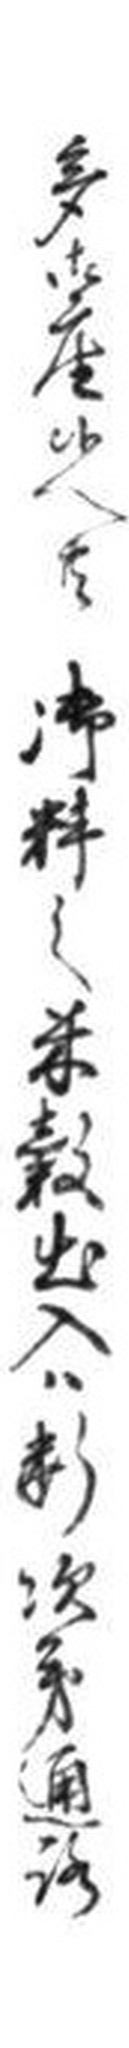多御座候へ共御料之米穀出入ハ断次第通路
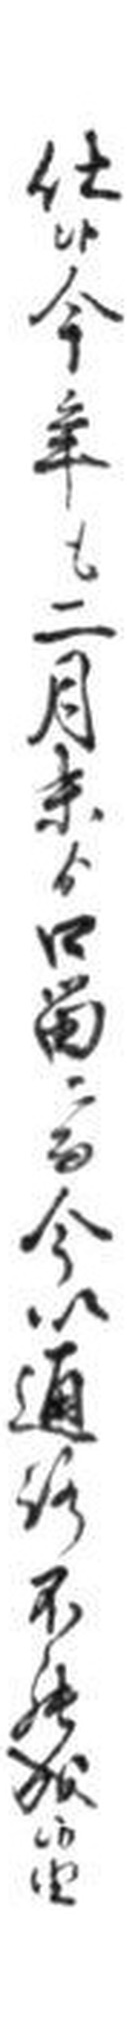仕候今年も二月末ゟ口留ニ而今以通路不罷成候由
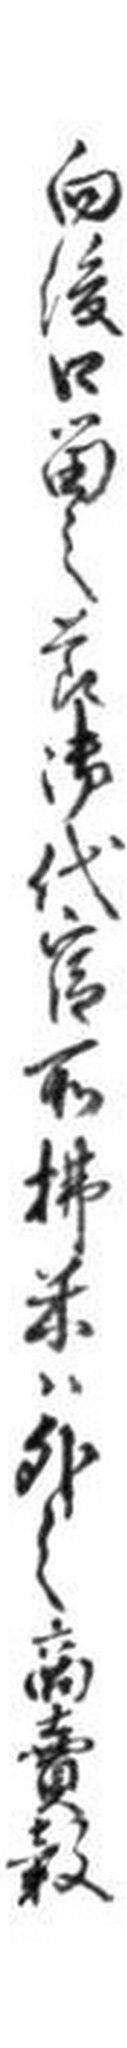向後口留之節御代官所払米ハ外之商売穀
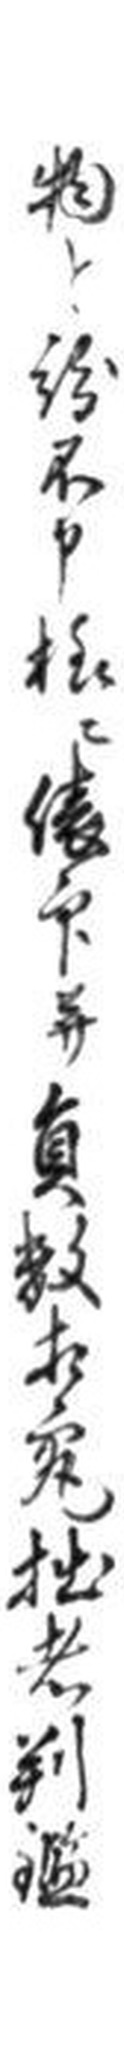物と紛不申様ニ俵印并員数相究拙者判鑑
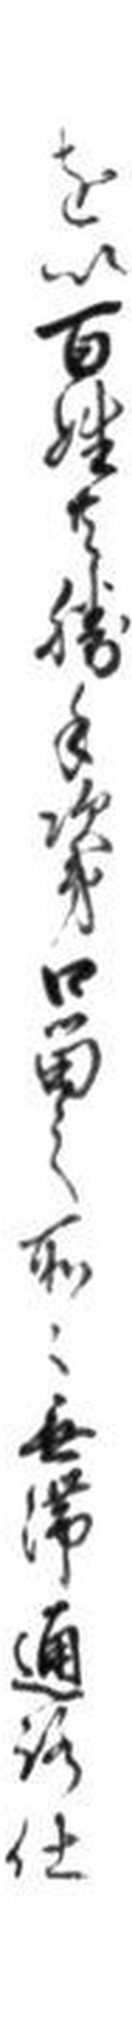を以百姓共勝手次第口留之所々無滞通路仕
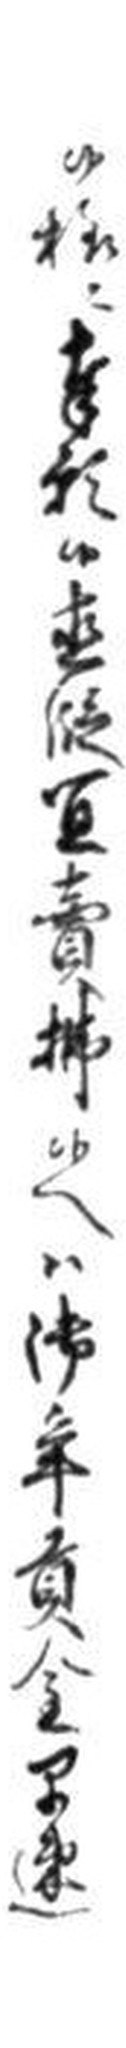候様ニ奉願候直段宜売払候ヘハ御年貢金早速
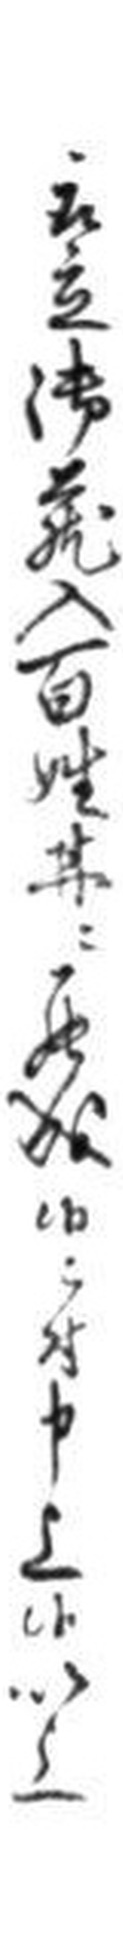取立御蔵入百姓甘ニ罷成候ニ付申上候以上
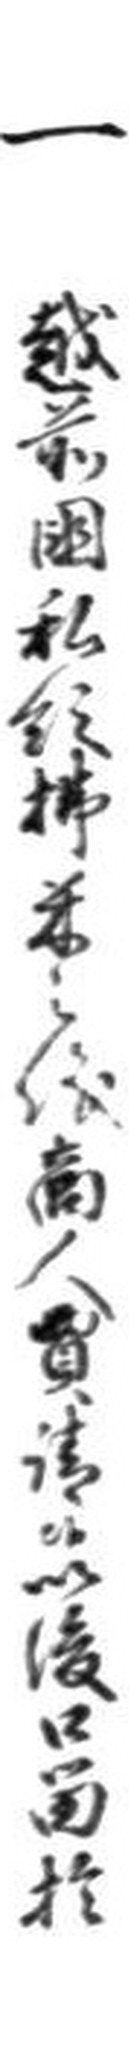一越前国私領払米之儀商人買請候以後口留於
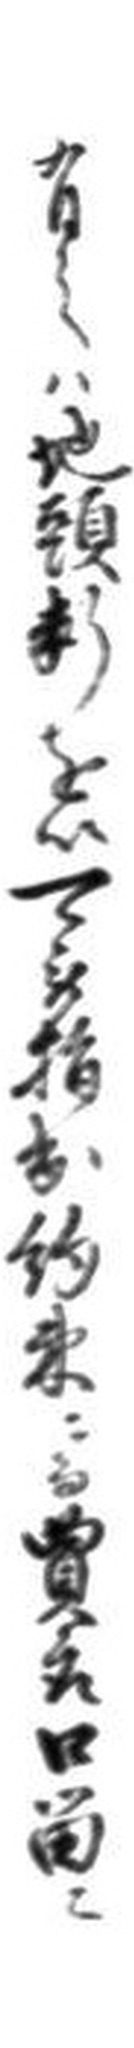有之ハ地頭断を以可被指出約束ニ而買取口留ニ
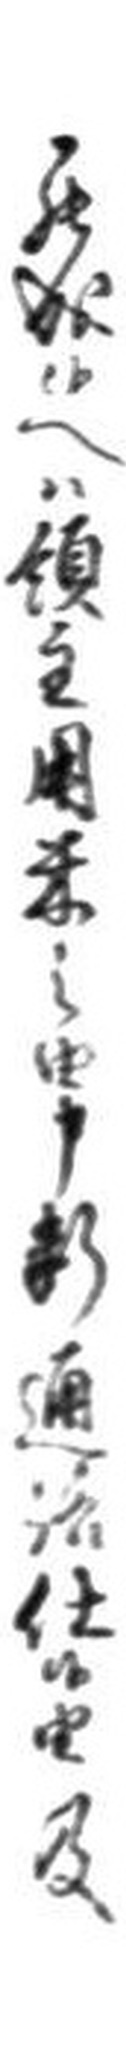罷成候ヘハ領主用米之由申断通路仕候由及
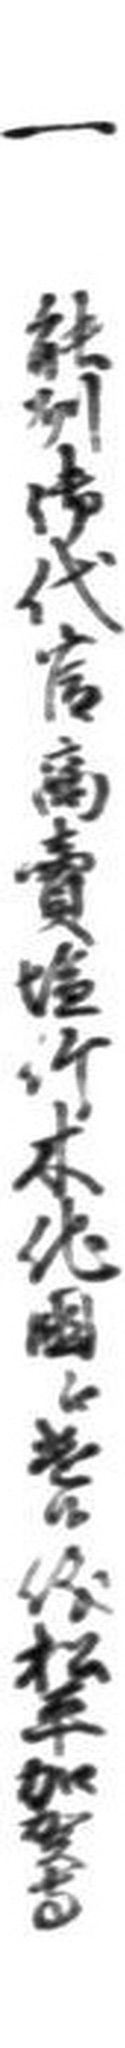一能州御代官商売塩竹木他国江遣候儀松平加賀守
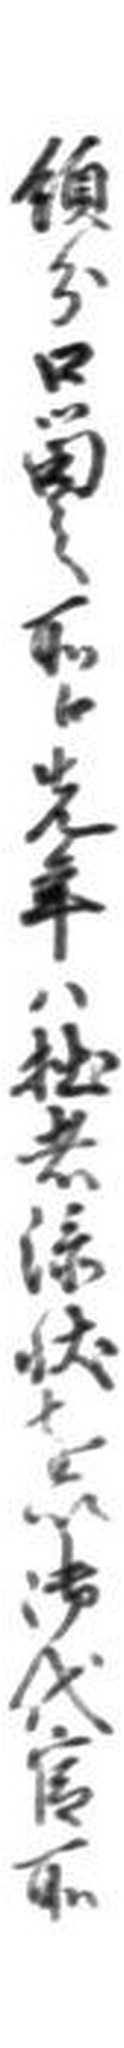領分口留之所江先年ハ拙者添状を以御代官所
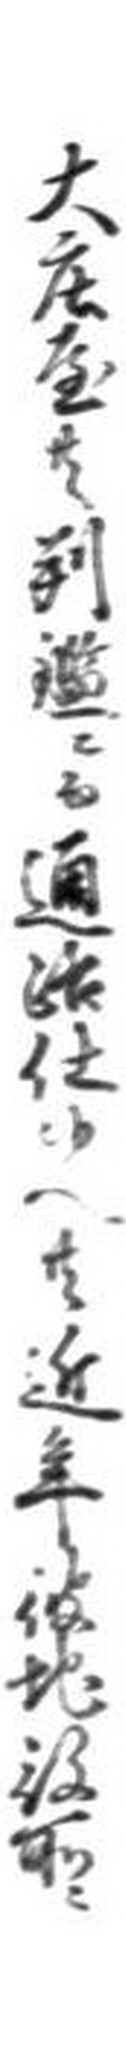大庄屋共判鑑ニ而通路仕候へ共近年彼地役所ニ
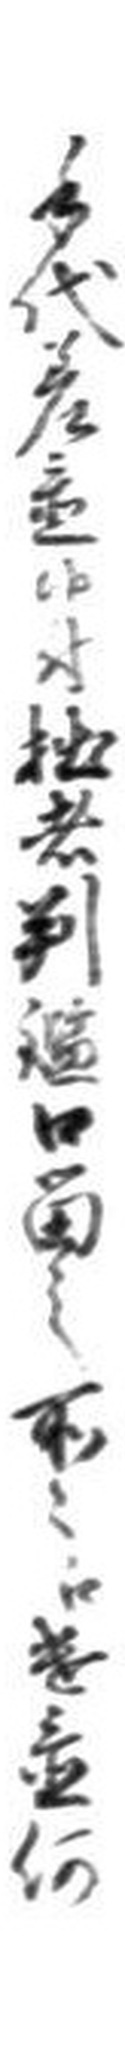手代差置候付拙者判鑑口留之所々江遣置何

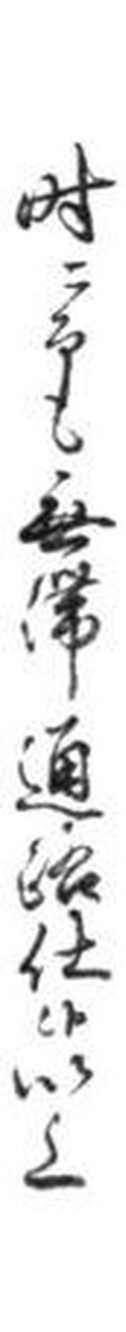時ニ而も無滞通路仕候以上
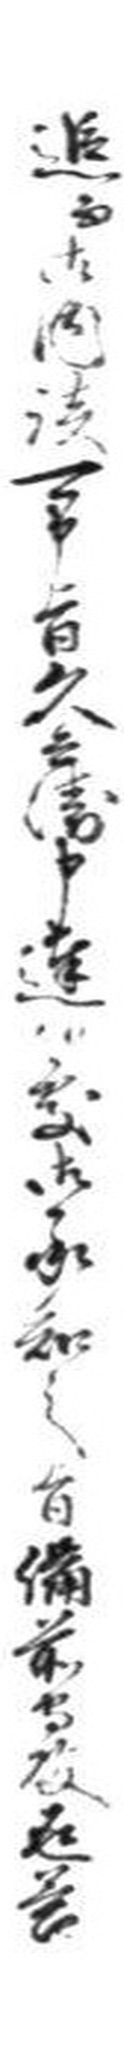追而御内談可申旨久兵衛申達候処御承知之旨備前守殿返答
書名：家譜 二十二 吉品公 従元禄十五年到同十六年
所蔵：福井県文書館 Fukui Prefectural Archives
